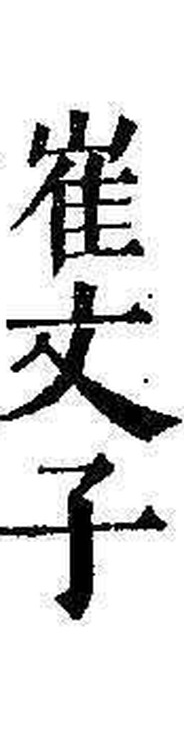崔丈子
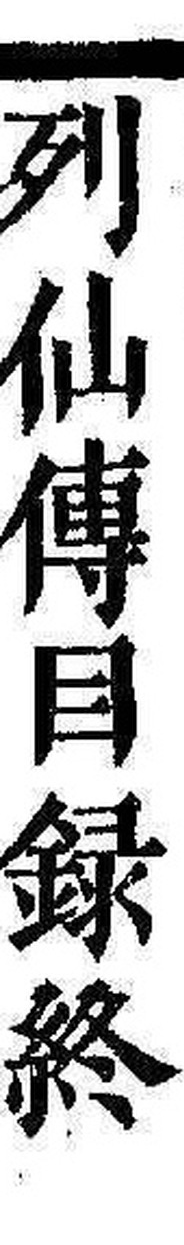列仙伝目録終
